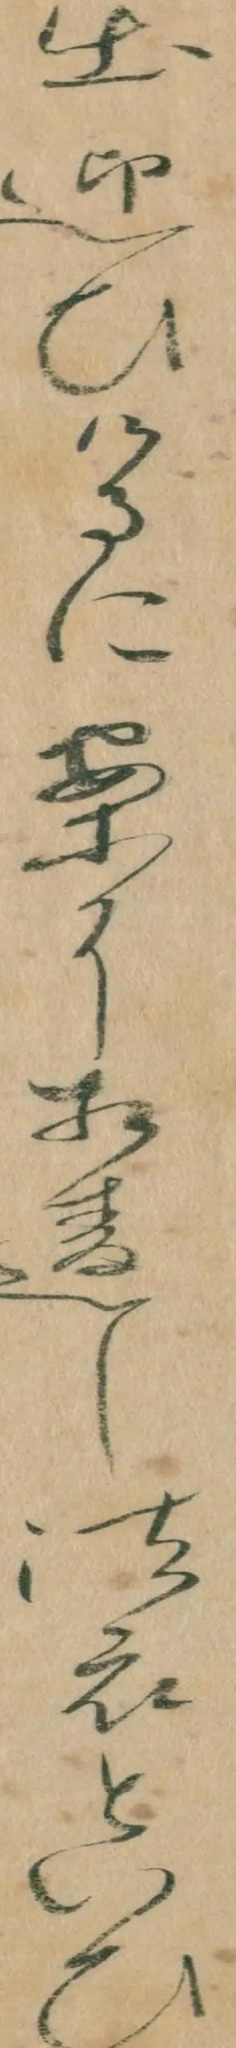出迎ひけるに案に相違し法衣といひ
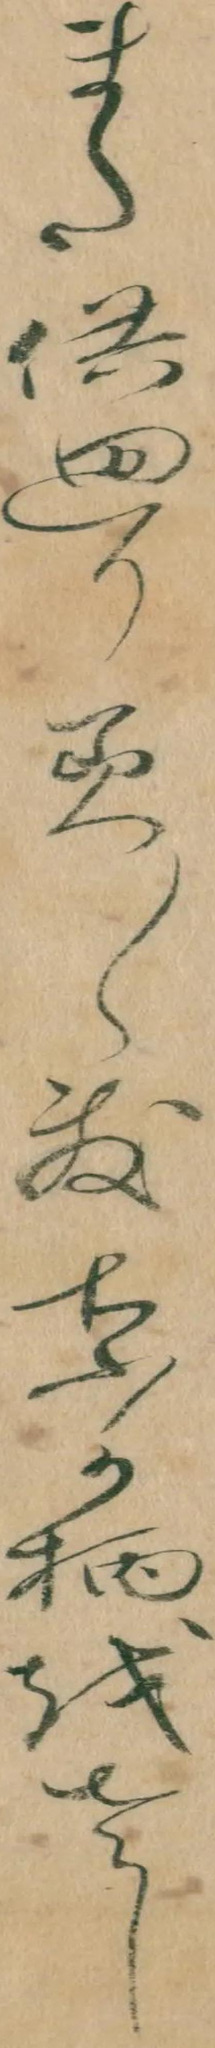また供廻り美〳〵敷なか柄をさし
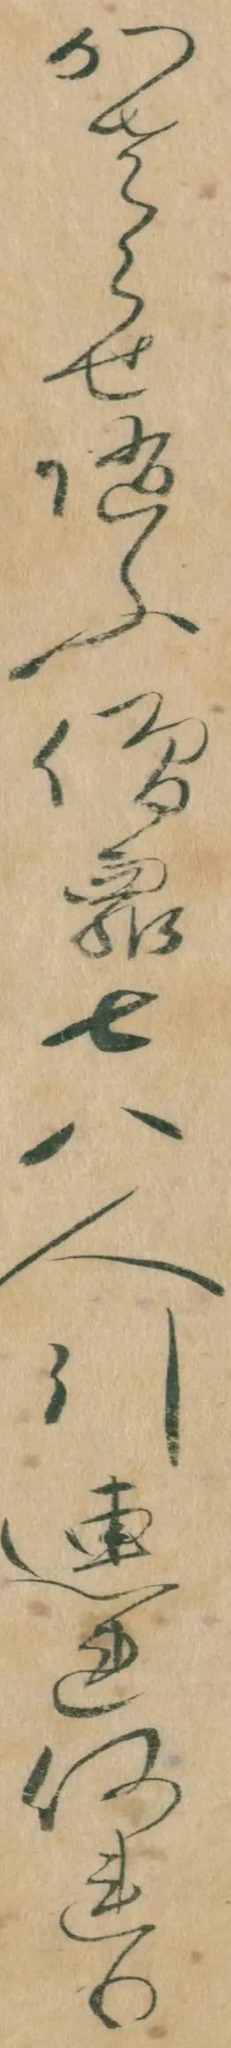かさらせ随ふ僧衆七八人引連何れも
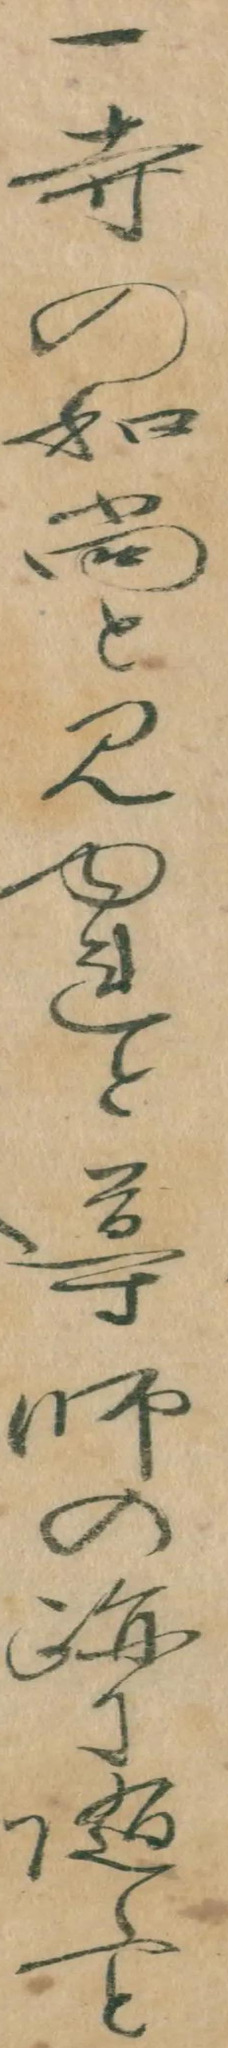一寺の和尚と見ゆれと導師の跡に随ふと
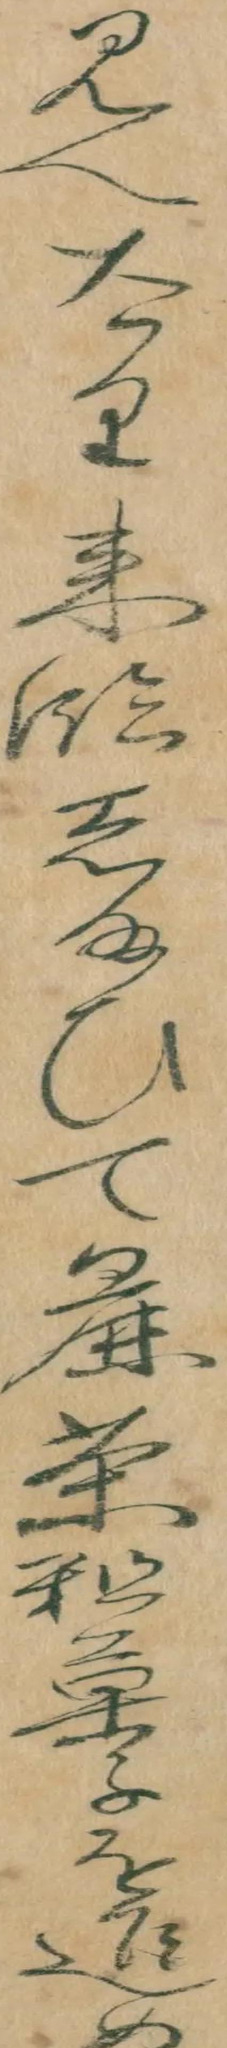見へたり来臨し給ひて麤茶和菓子を進め
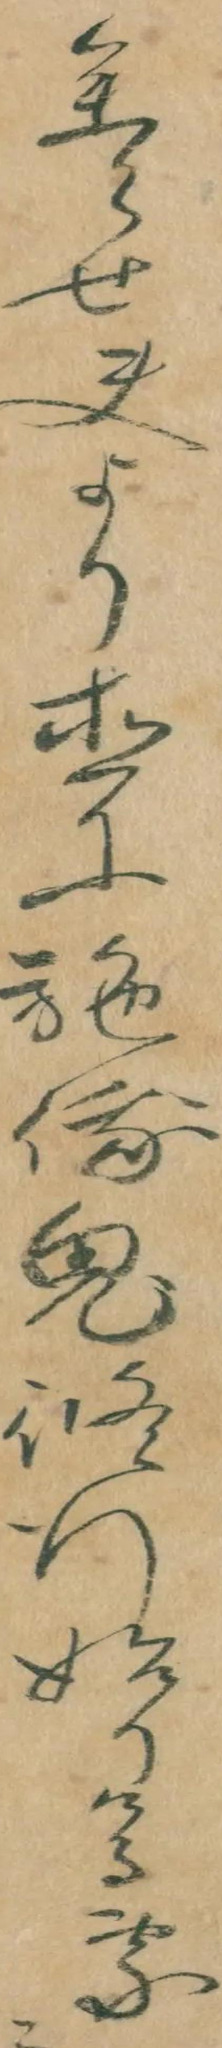参らせ夫より直に施餓鬼修行始りける處に

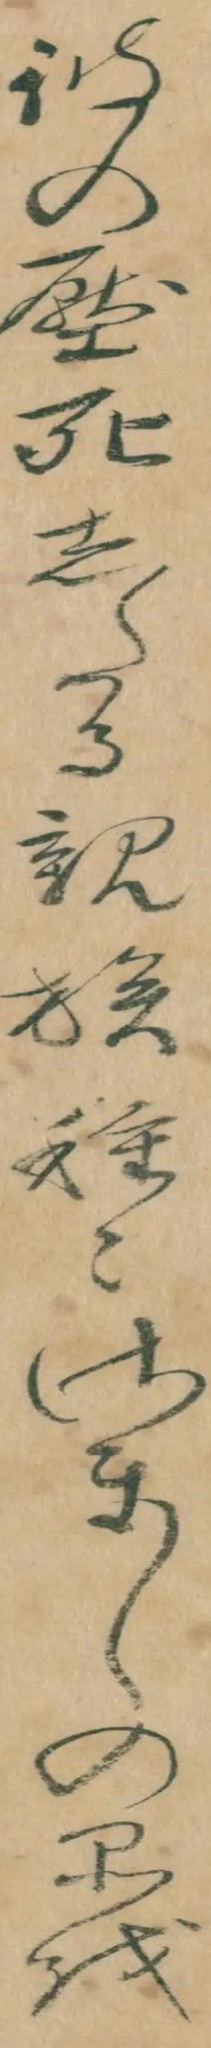彼の圧死したる親族種々さま〳〵の品を
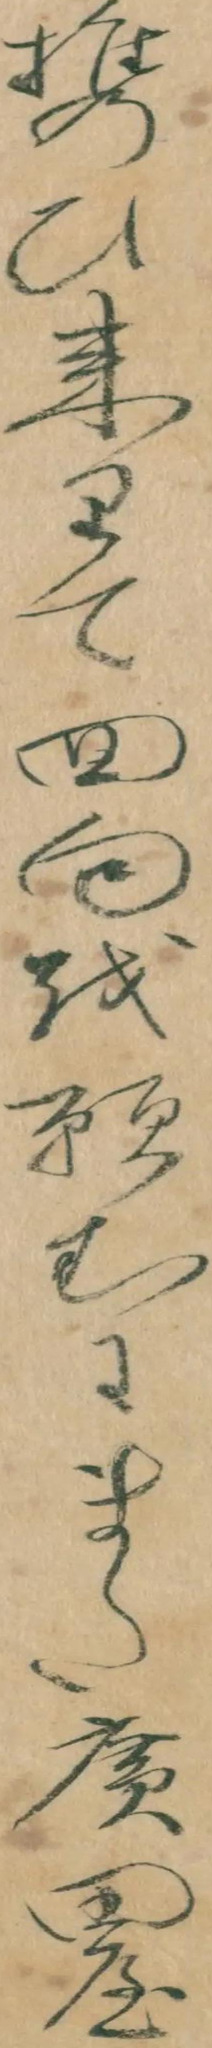携ひ来りて回向を頼むにまた広田屋
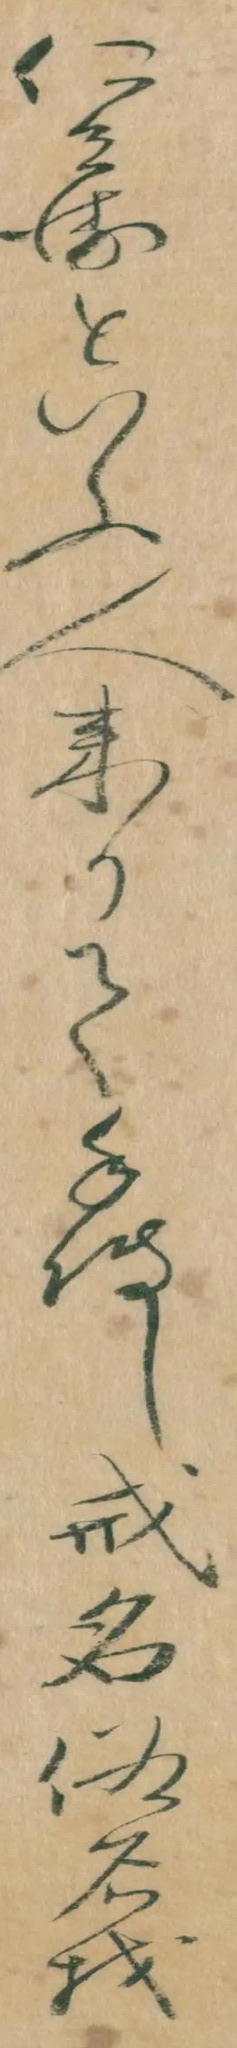仁兵衛といふ人来りて手伝し戒名俗名を
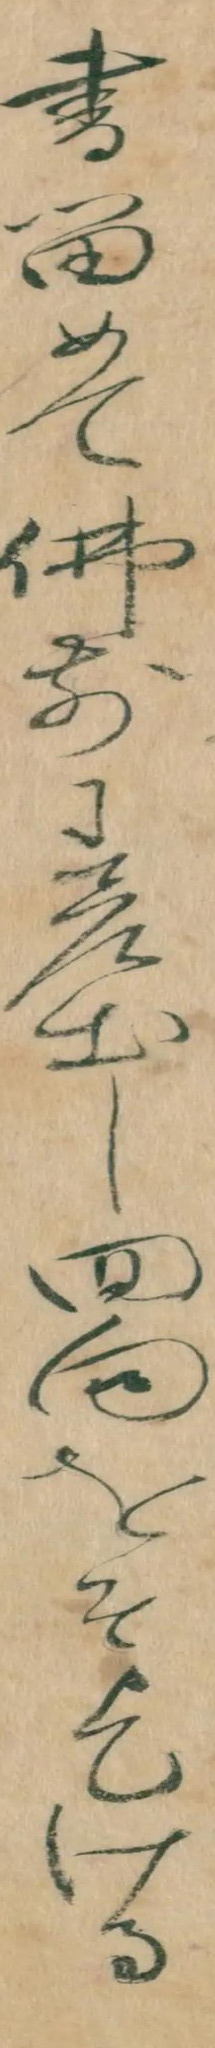書留めて仏前に差出し回向をそ乞ける
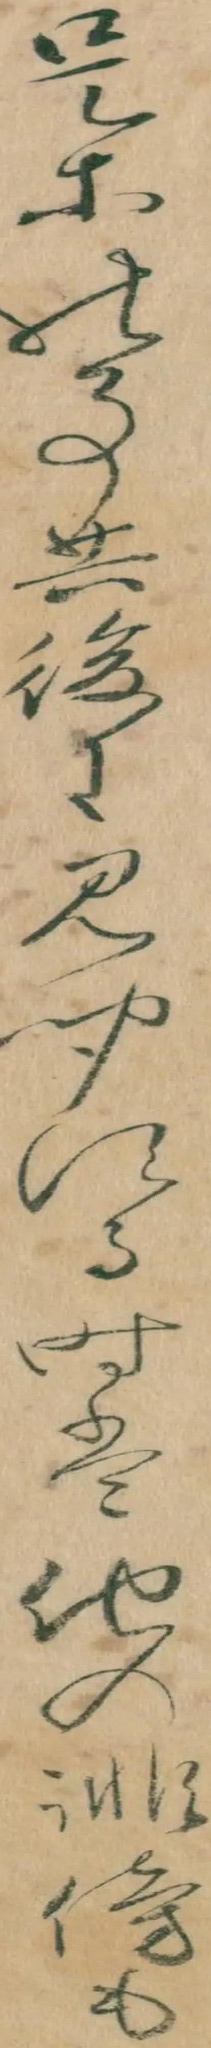是等の事共後に見聞する時は他の誹謗も
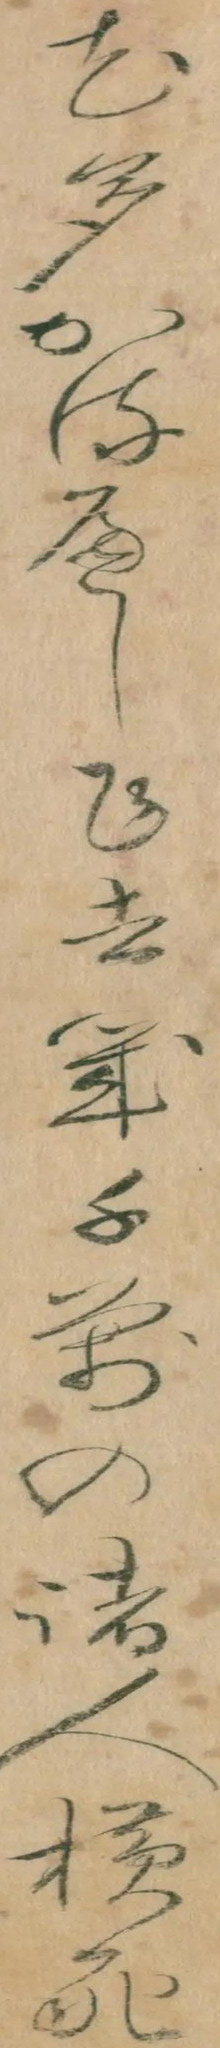尤多かるへし乍去幾千萬の諸人横死
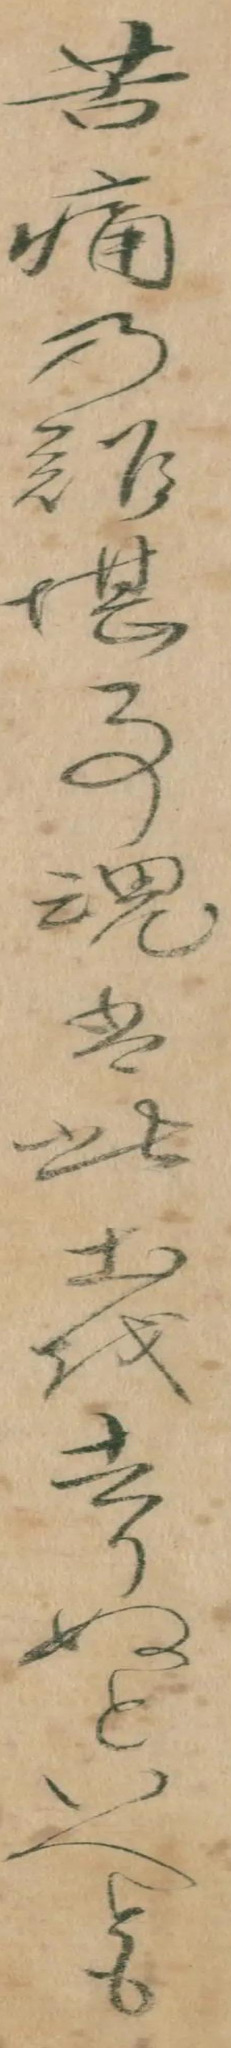苦痛の難堪事魂は此土を去りぬといへとも
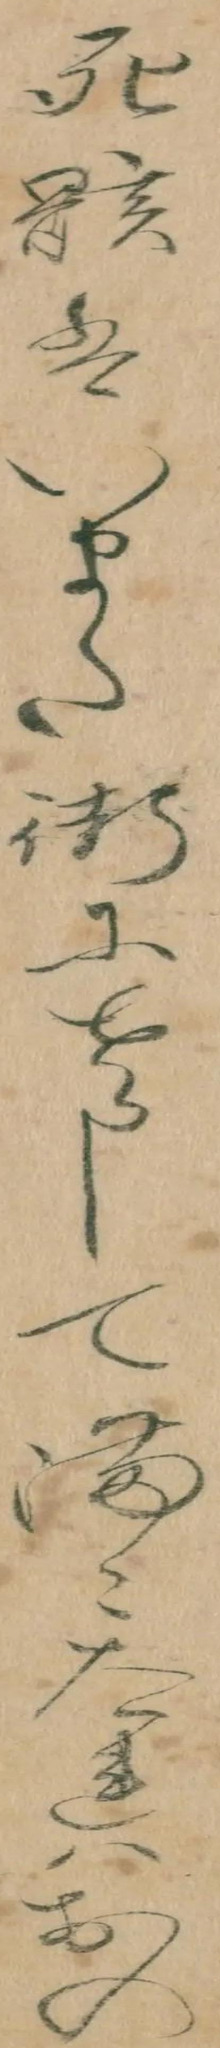死骸はいまた街にさらして満々たれはおの
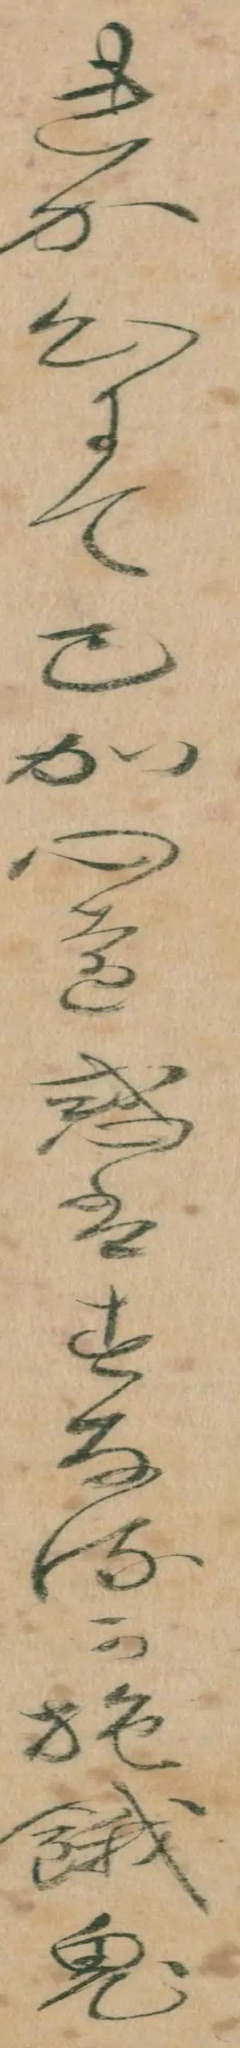れか心にて己か心を惑はすなるか施餓鬼
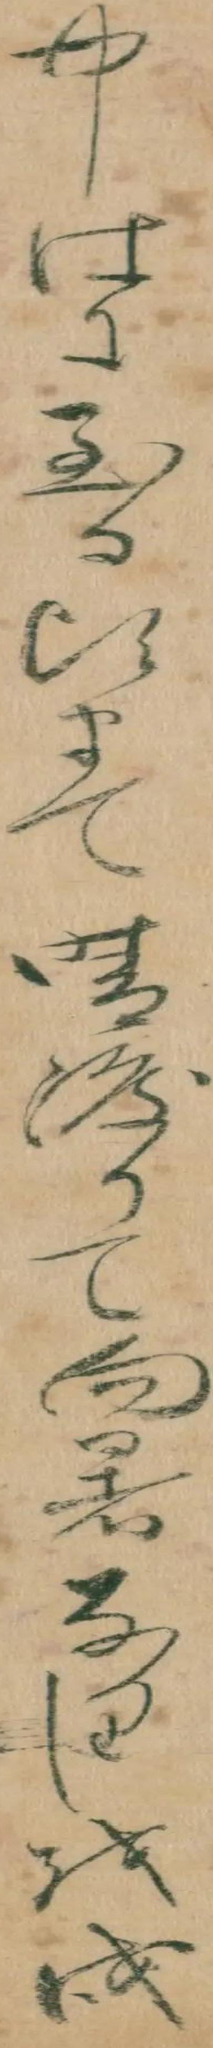中はに至る頃まて晴渡りて向暑なりしを戌
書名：俗語之種. [5]
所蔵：国立国会図書館 National Diet Library, JAPAN
